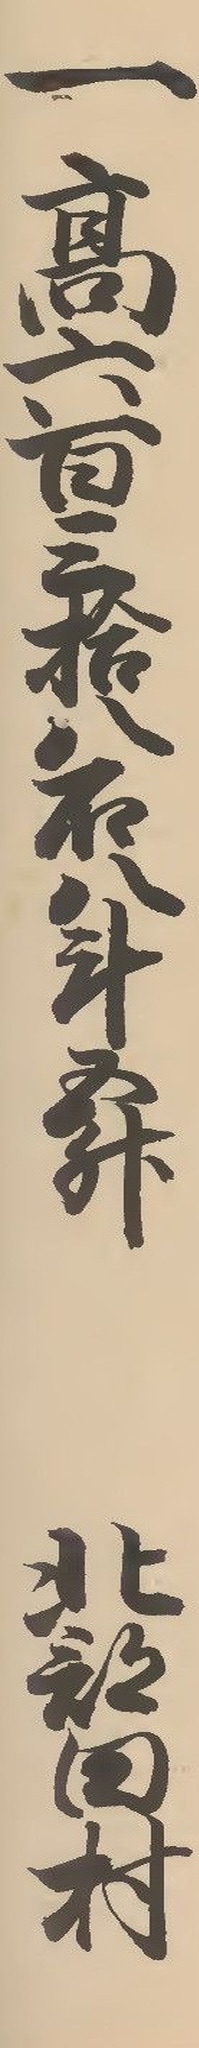一髙六百三拾八石八斗五升北部田村
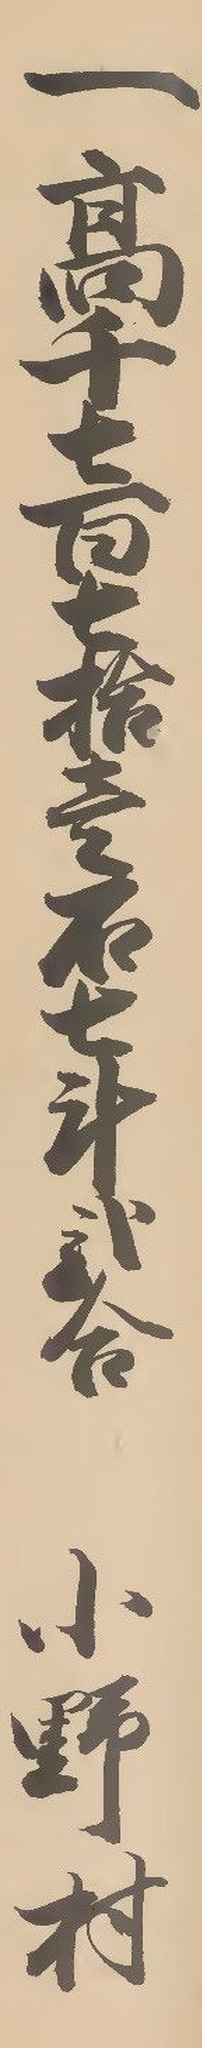一髙千七百七拾壱石七斗弐合小野村
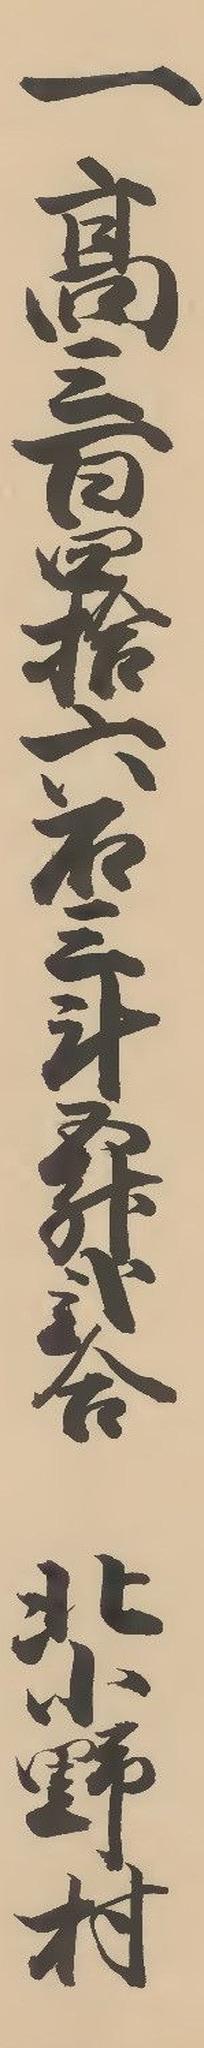一髙三百四拾六石三斗五升弐合北小野村
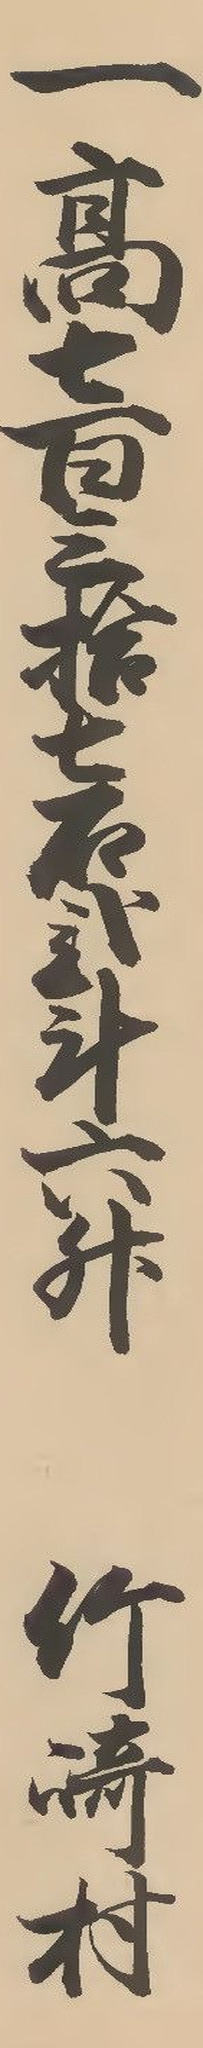一髙七百三拾七石弐斗六升竹崎村
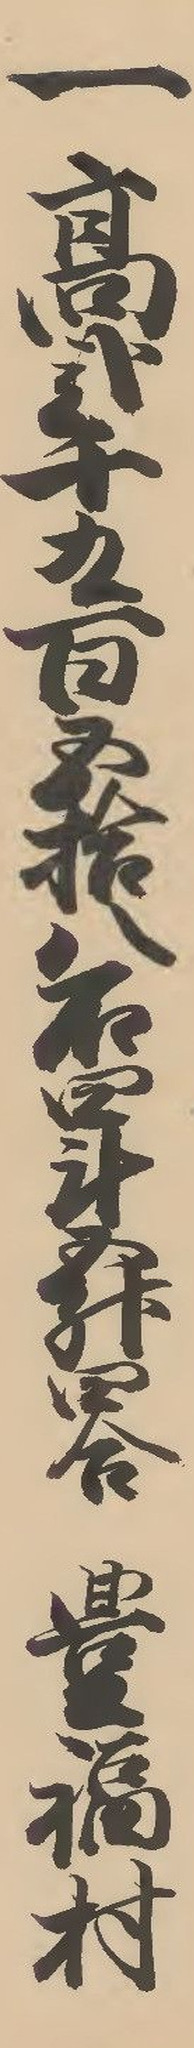一髙弐千九百五拾八石四斗五升四合豊福村

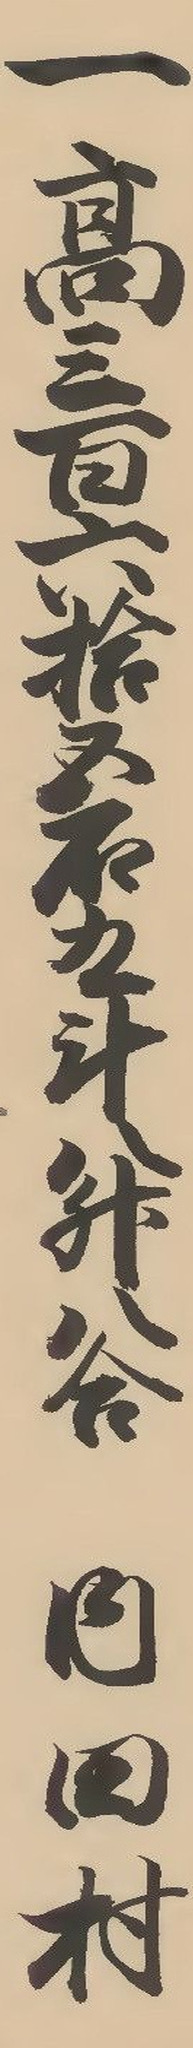一髙三百六拾五石九斗八升八合内田村
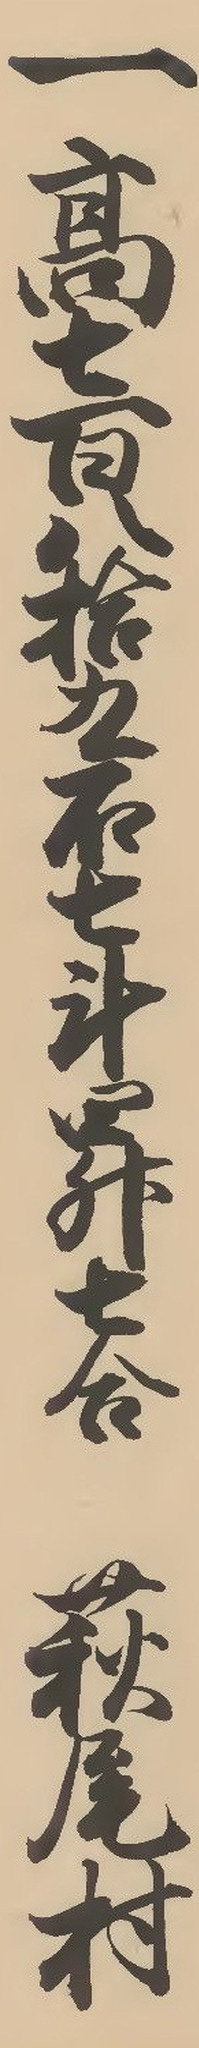一髙七百八拾九石七斗四升七合萩尾村
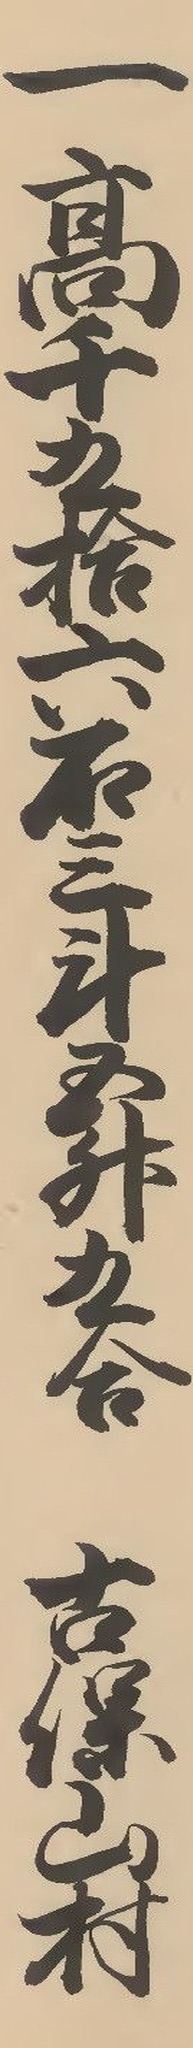一髙千九拾六石三斗五升九合古保山村
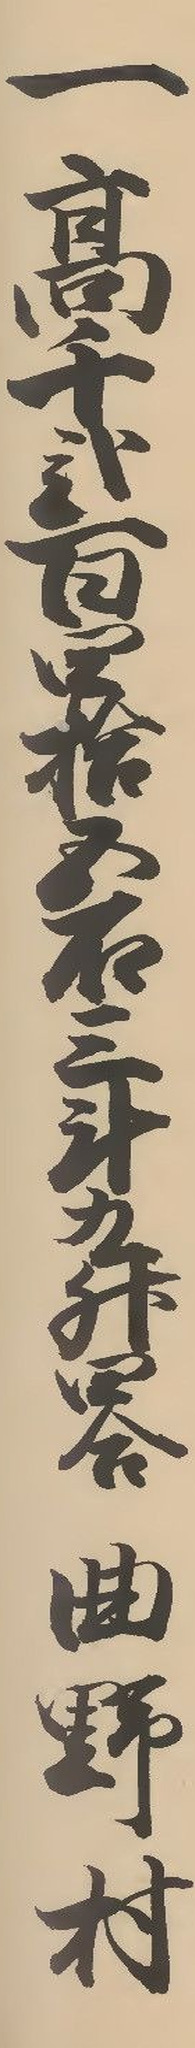一髙千弐百四拾五石三斗九升四合曲野村
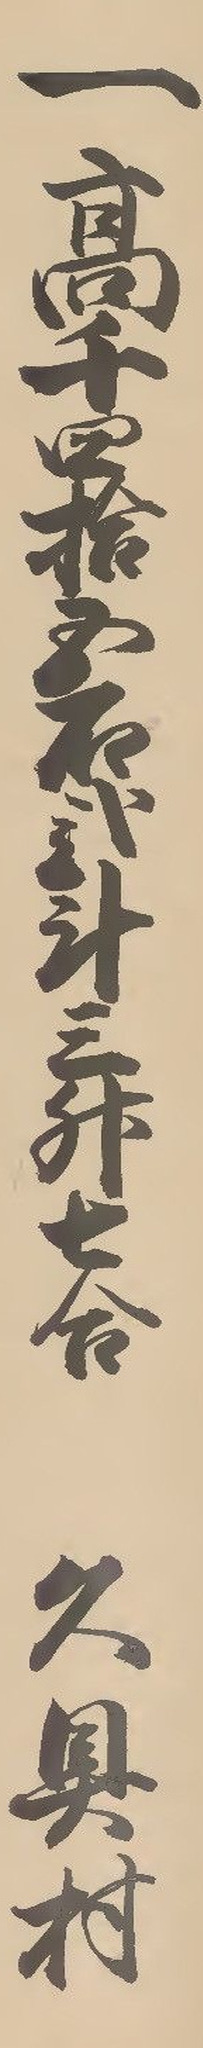一髙千四拾五石弐斗三升七合久具村
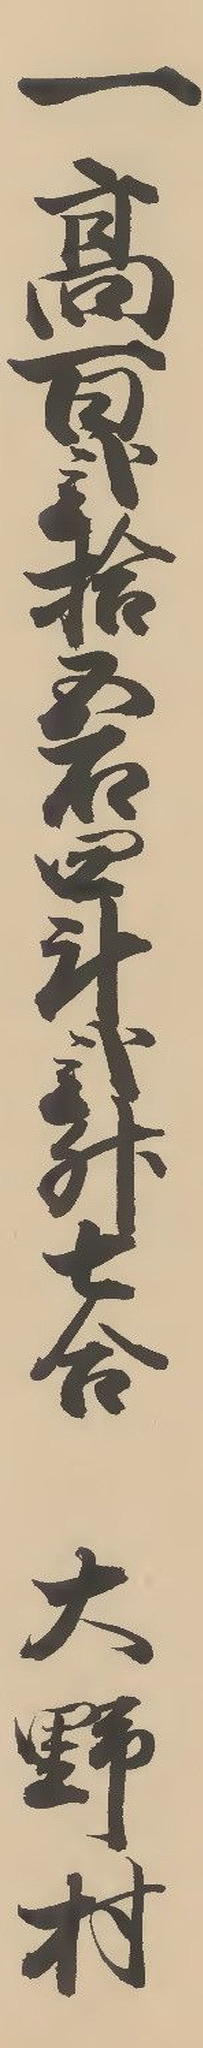一髙百弐拾五石四斗弐升七合大野村
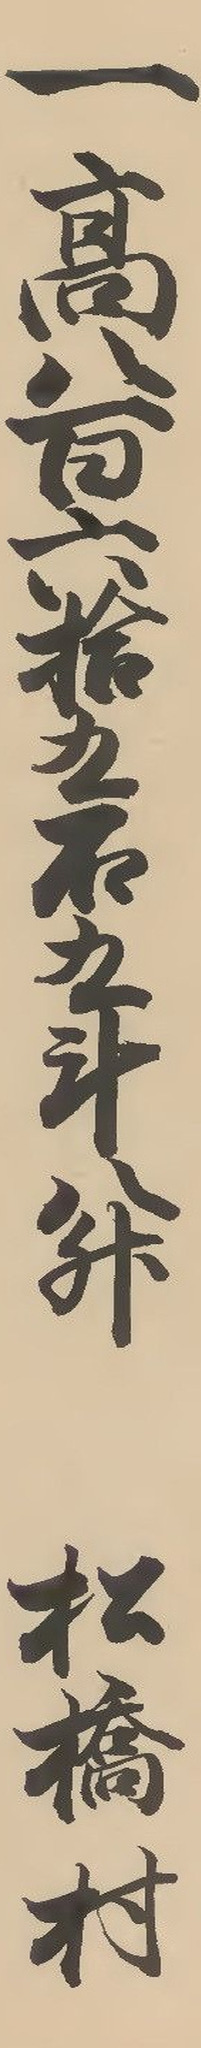一髙八百六拾九石九斗八升松橋村

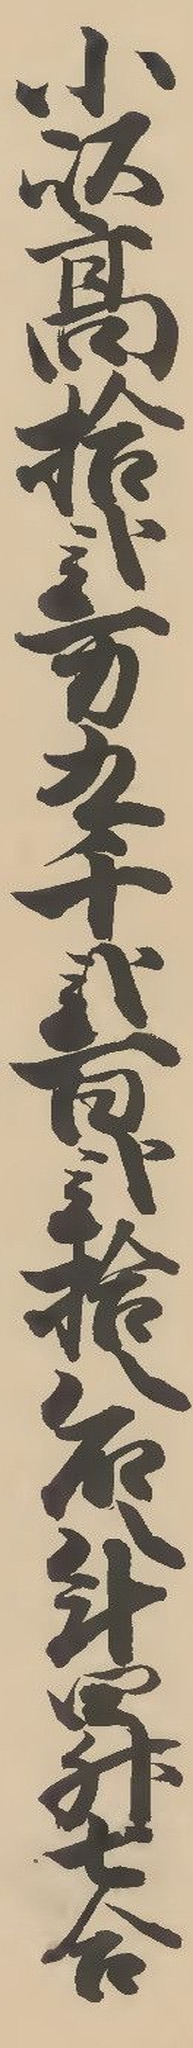小以髙拾弐万九千弐百弐拾八石八斗四升七合
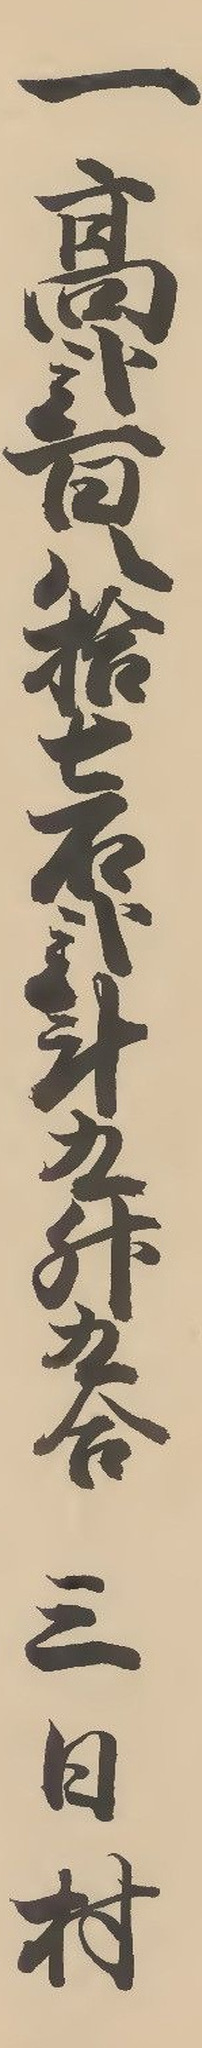一髙弐百八拾七石弐斗九升九合三日村
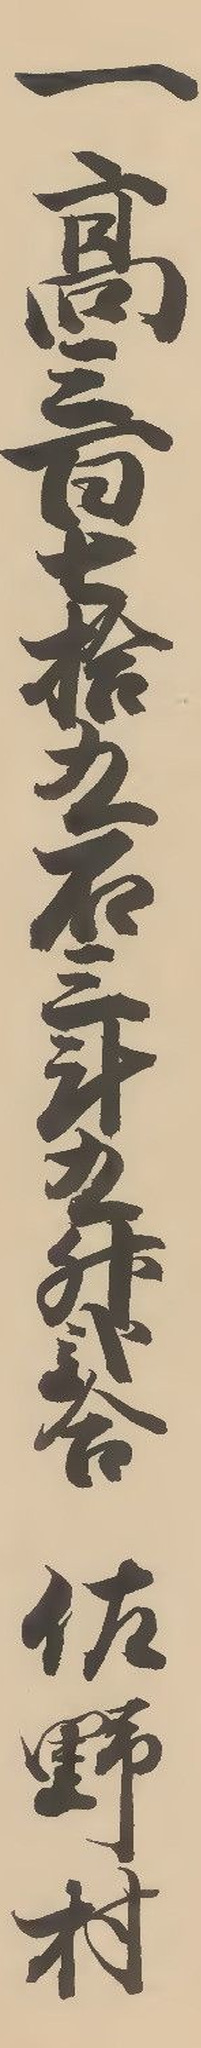一髙三百七拾九石三斗九升弐合佐野村
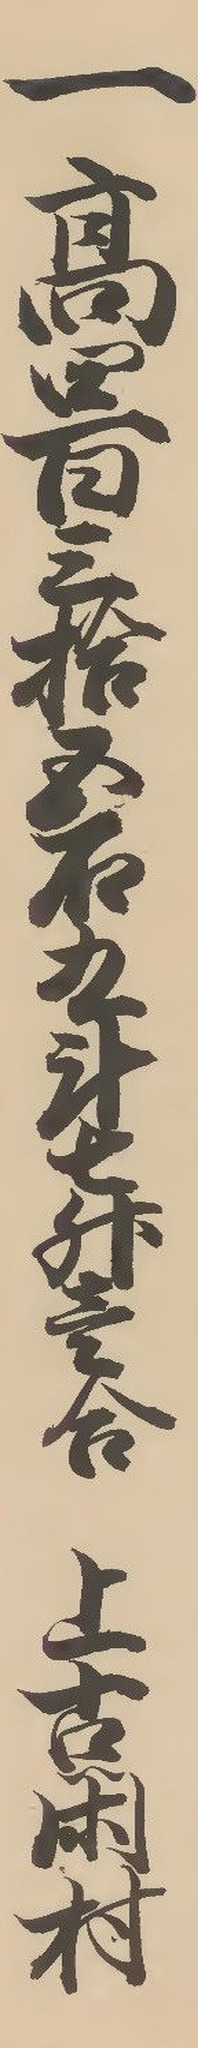一髙四百三拾五石九斗七升壱合上古閑村
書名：肥後国郷帳
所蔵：国立公文書館 National Archives of Japan
